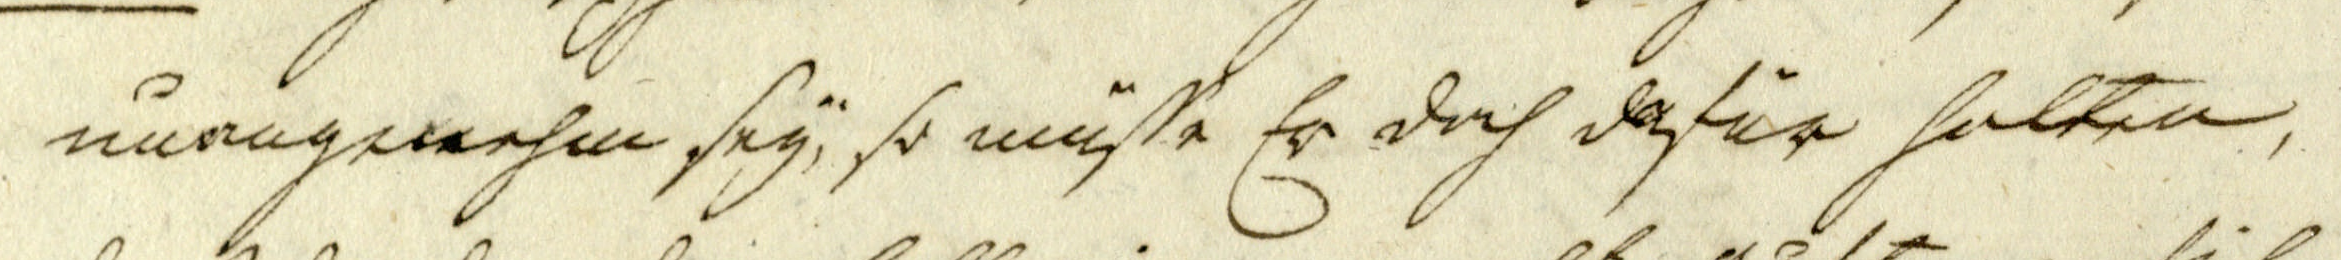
unangenehm seÿ, so müsse Er doch dafür halten,
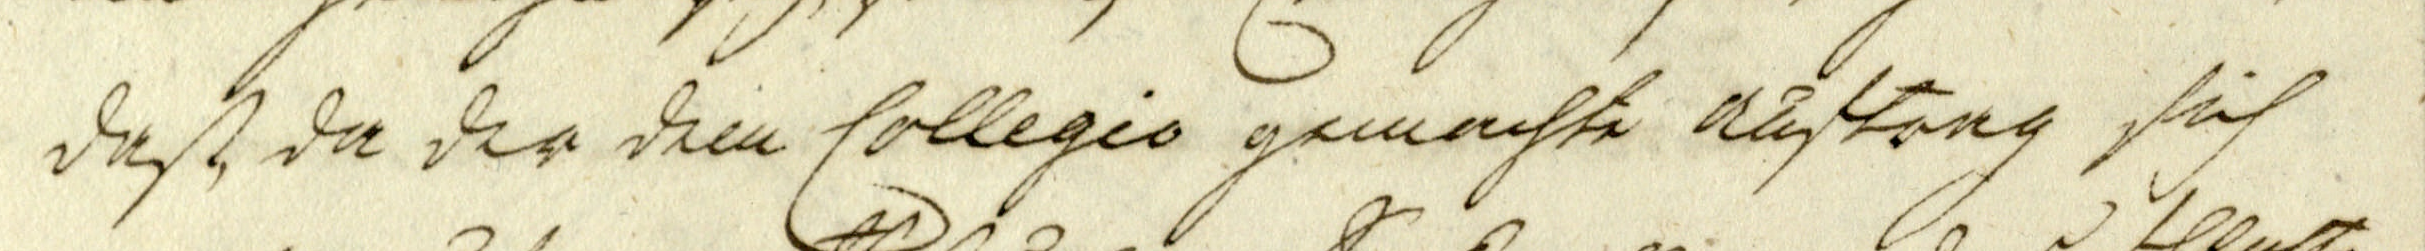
daß, da der dem Collegio gemachte Auftrag sich
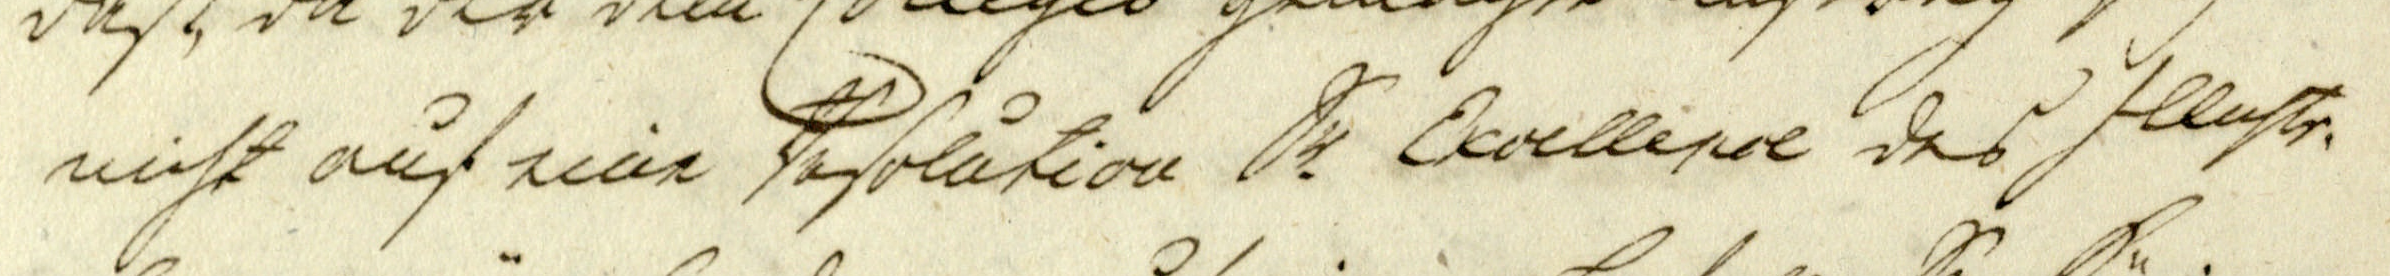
nicht auf eine Resolution Sr. Excellence des Illustr.
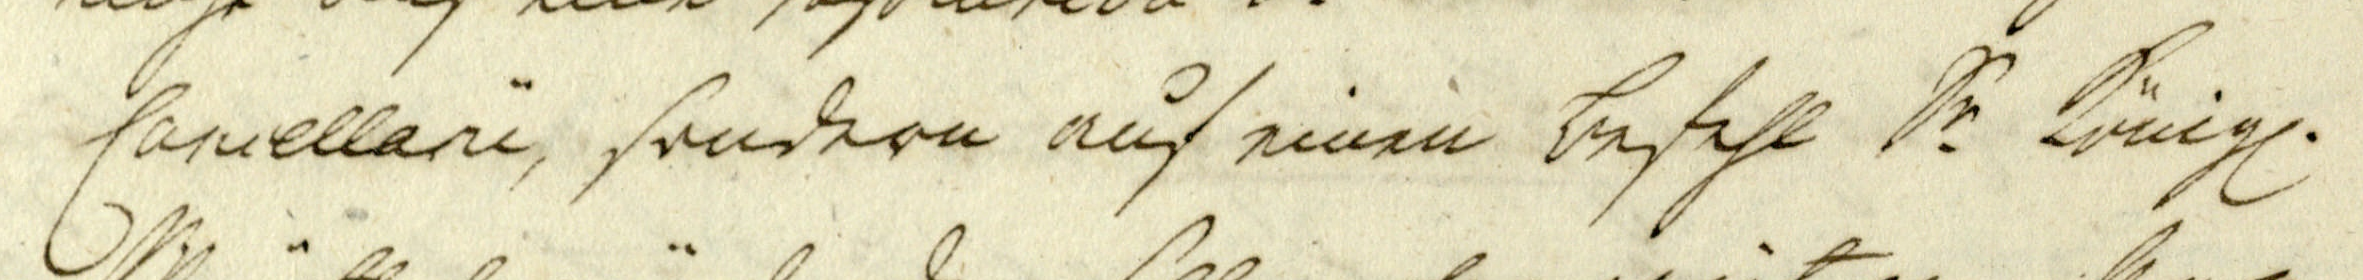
Cancellarii, sondern auf einen Befehl Sr. Königl.
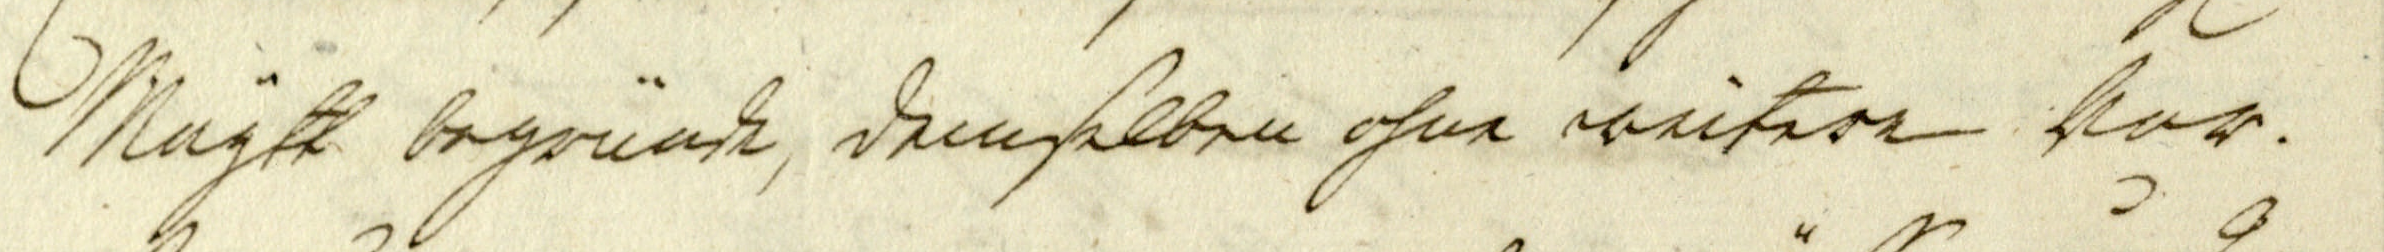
Maÿtt. begründe, demselben ohne weitere Vor¬
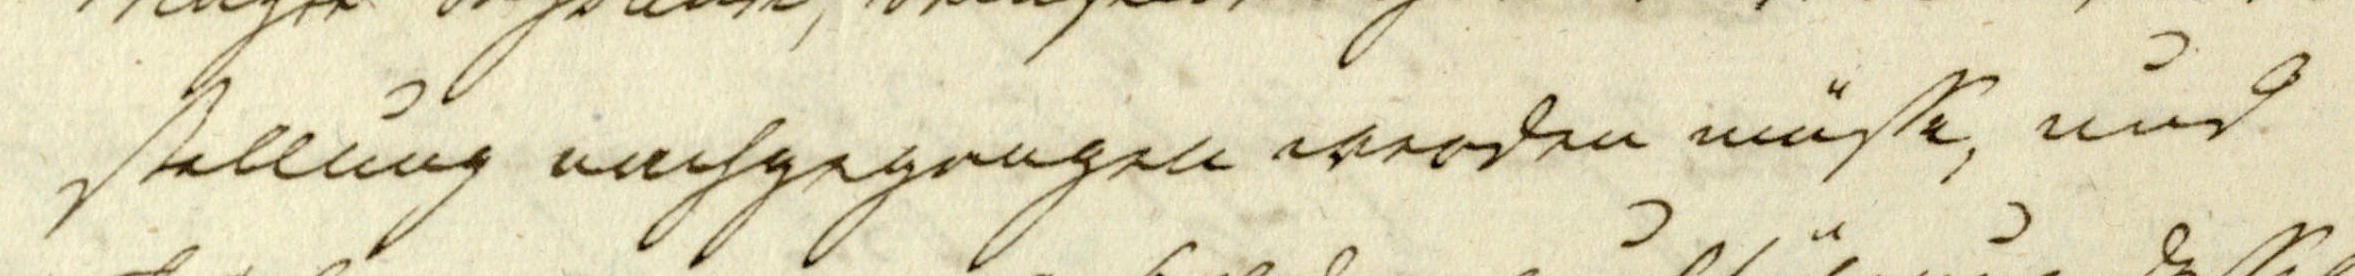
stellung nachgegangen werden müsse, und
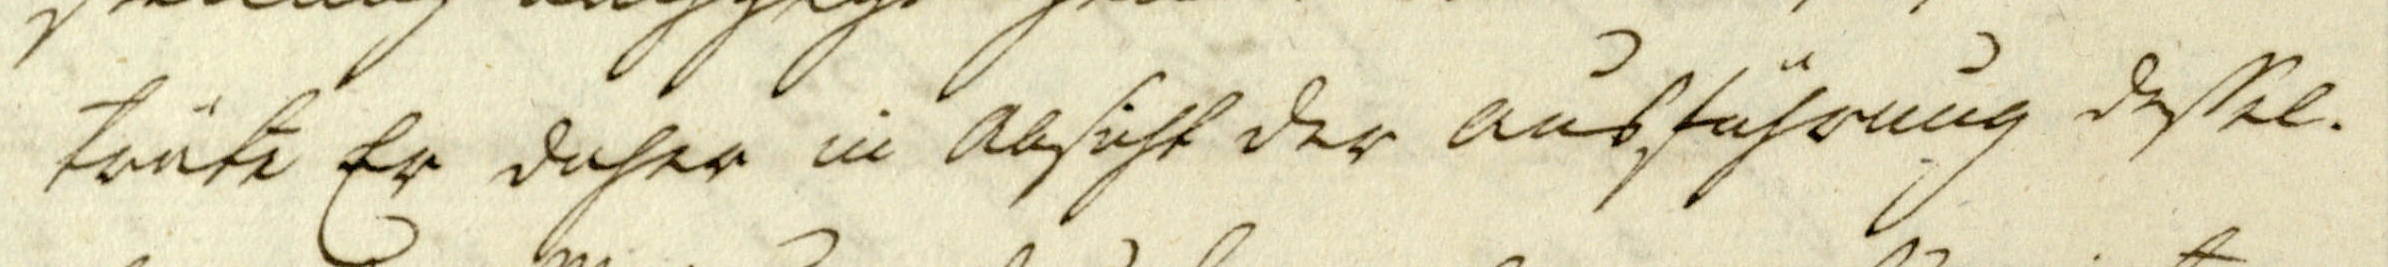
träte Er daher in Absicht der Ausführung dessel¬
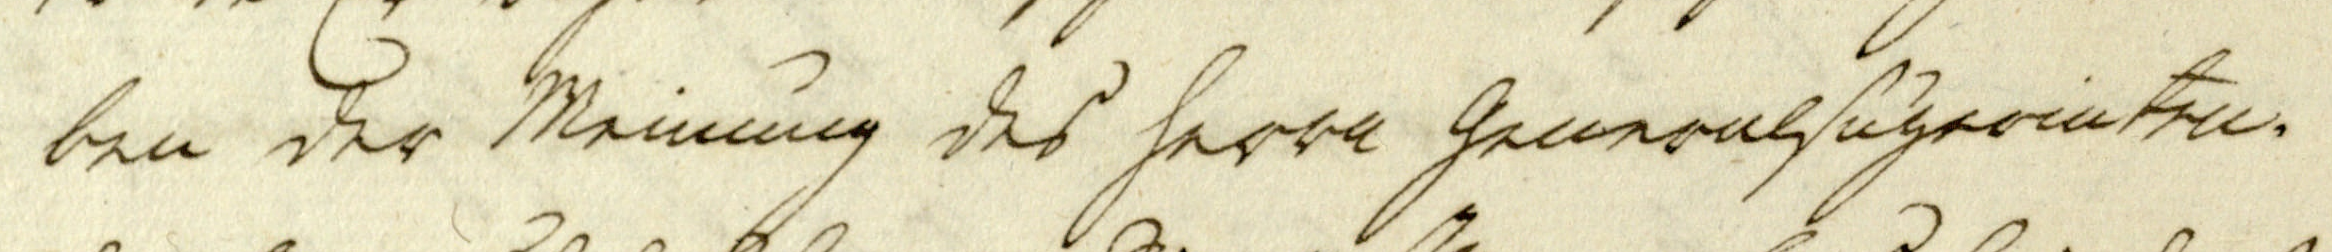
ben der Meinung des herrn Generalsuperinten¬
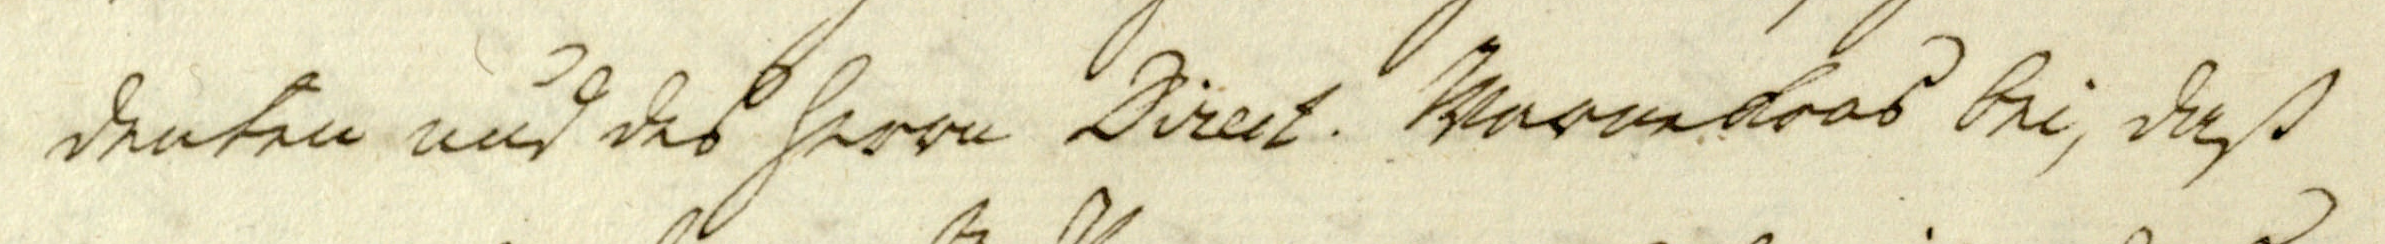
denten und des herrn Direct. Warnekros bei, daß
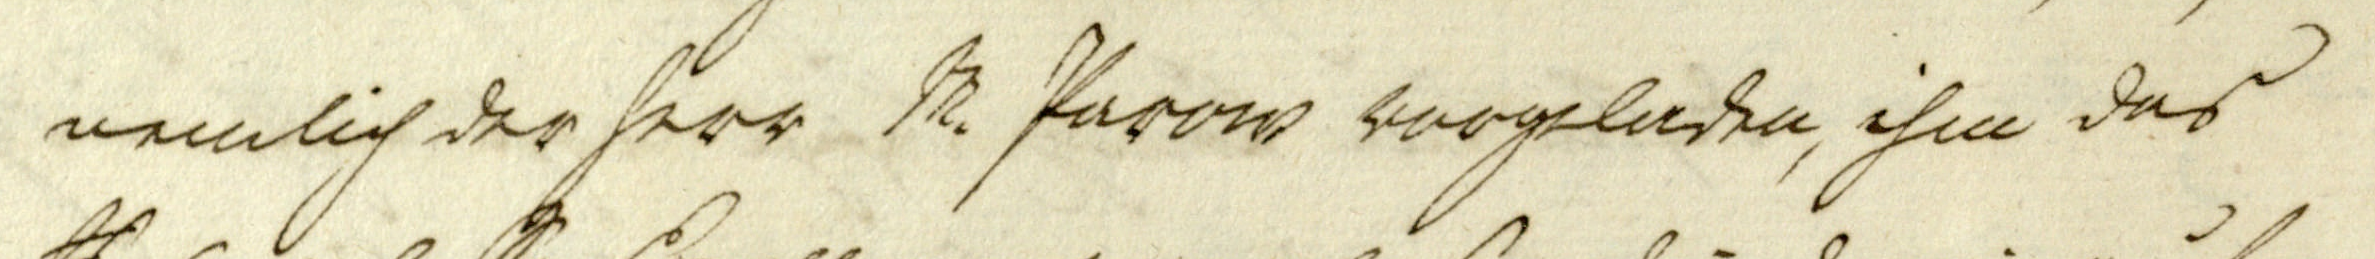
nemlich der Herr M. Parow vorgeladen, ihm das
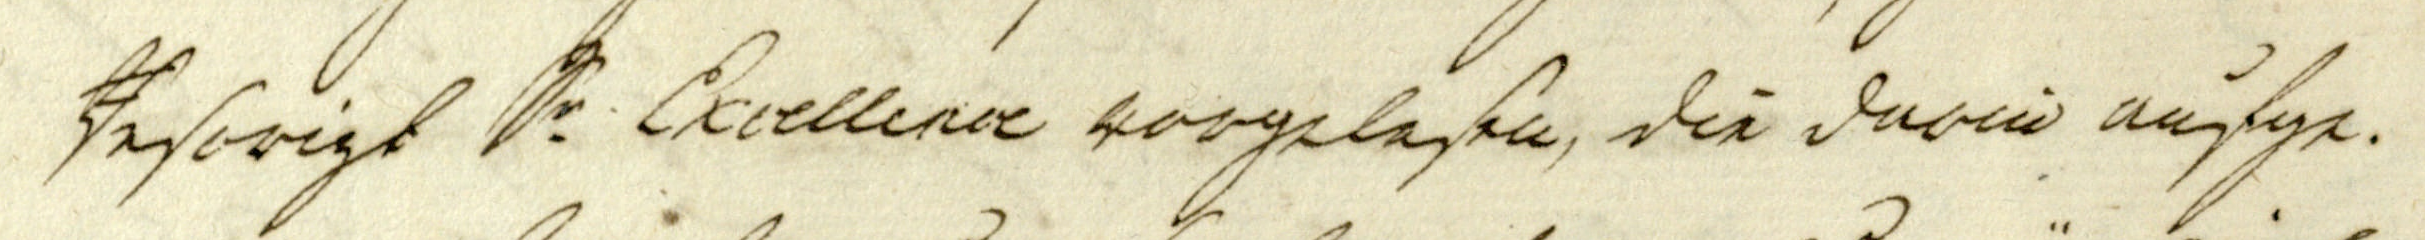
Rescript Sr. Excellence vorgelesen, die darin aufge¬
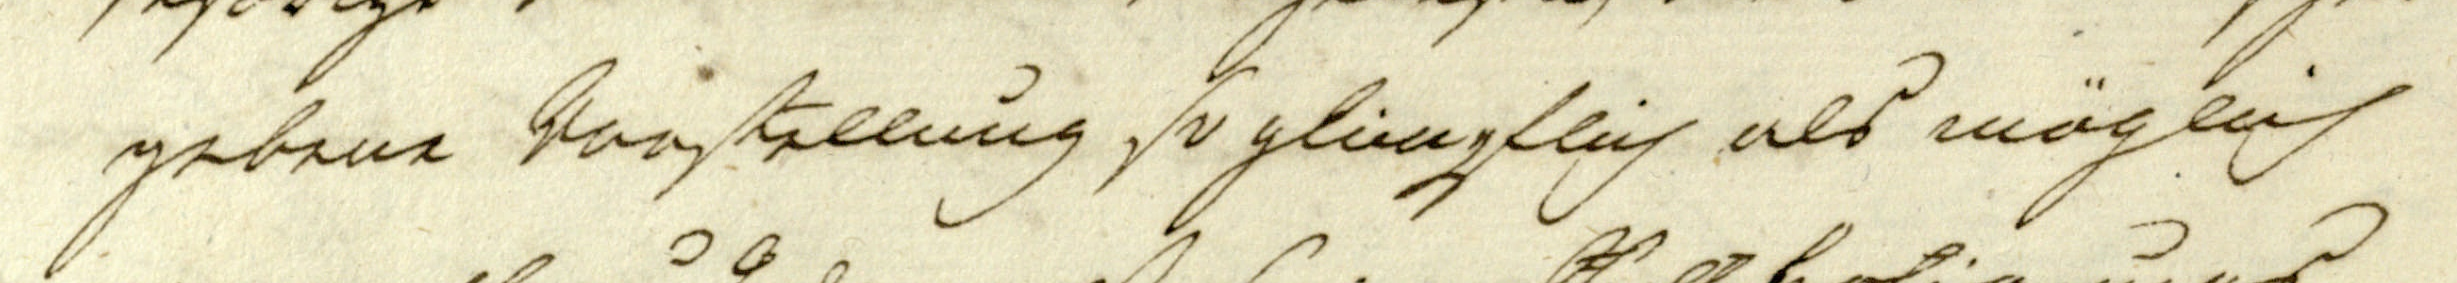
gebene Vorstellung so glimpflich als möglich
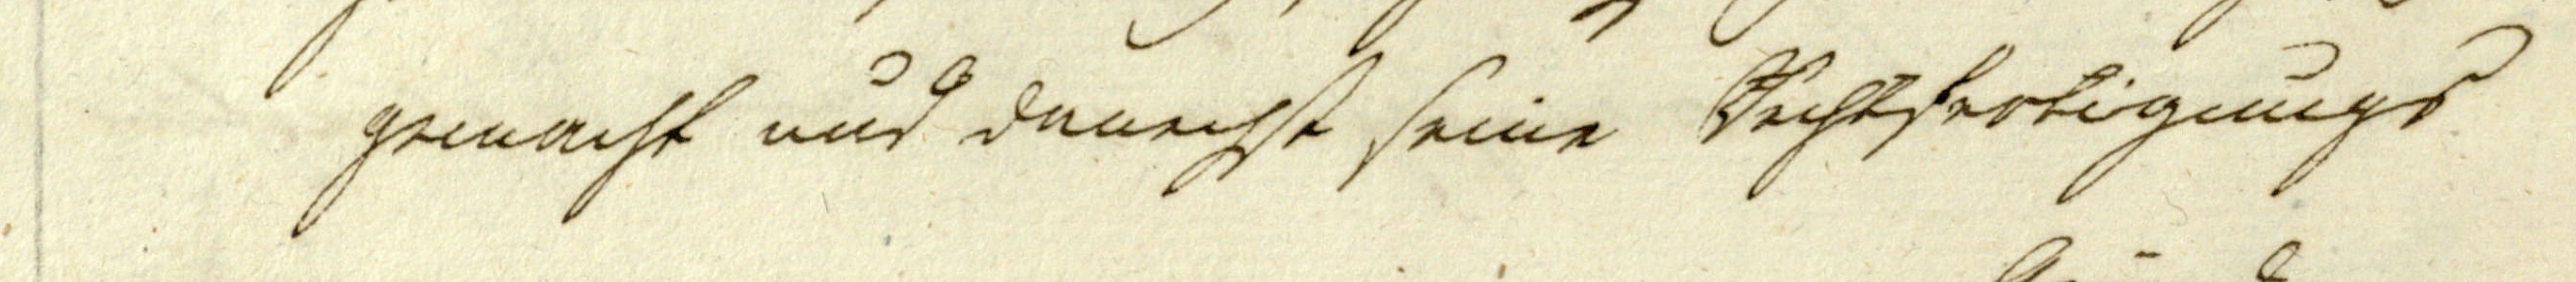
gemacht und danechst seine Rechtfertigungs
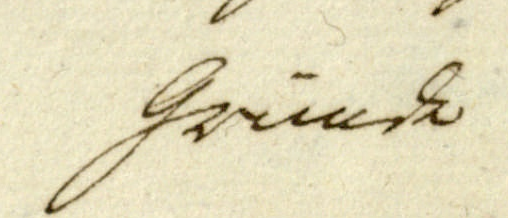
Gründe
